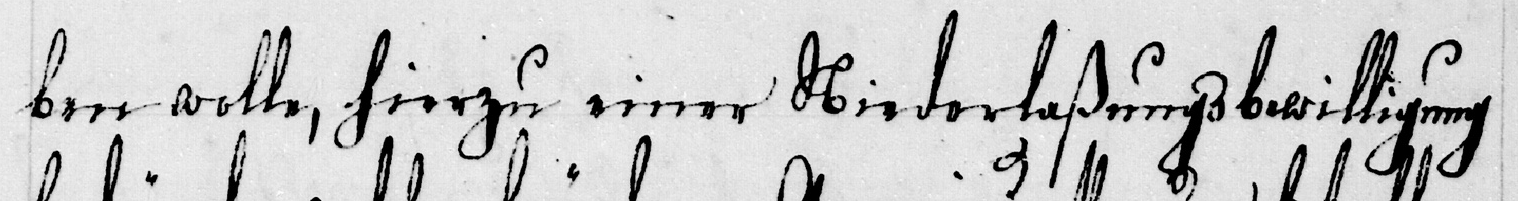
ben wolle, hierzu einer Niederlaßungsbewilligung
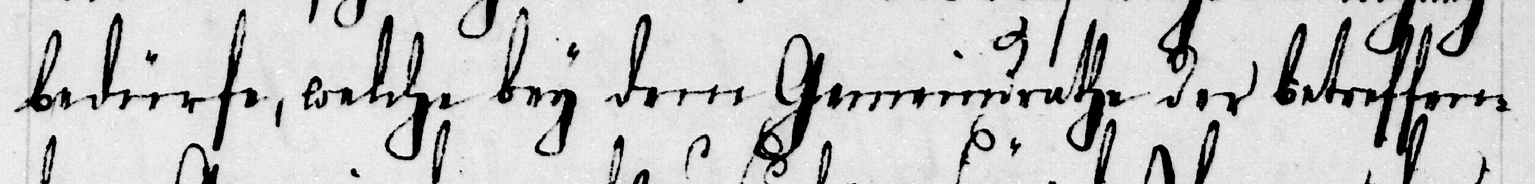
bedürfe, welche bey dem Gemeindsrathe der betreffen¬
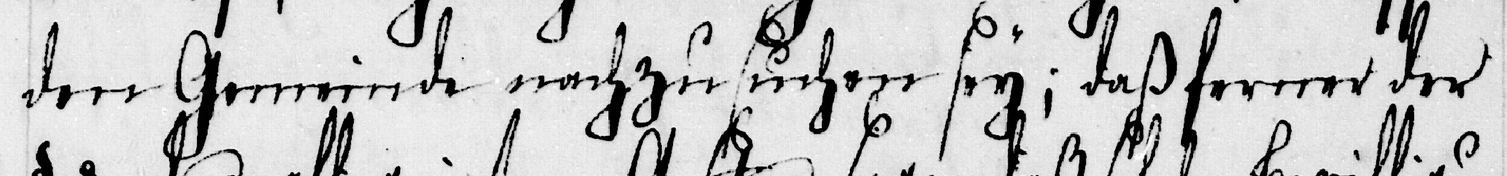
den Gemeinde nachzusuchen sey; daß ferner der
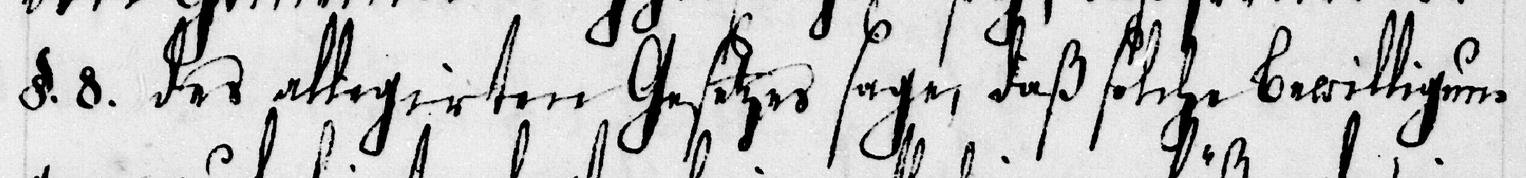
§. 8. des allegirten Gesetzes sage, daß solche Bewilligun¬
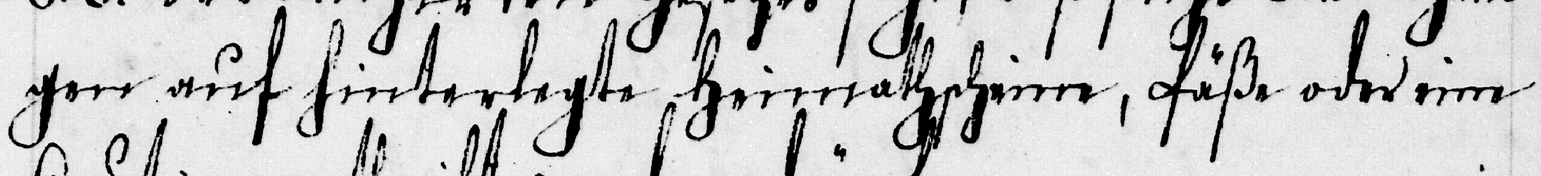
gen auf hinterlegte Heimathscheine, Päße oder eine
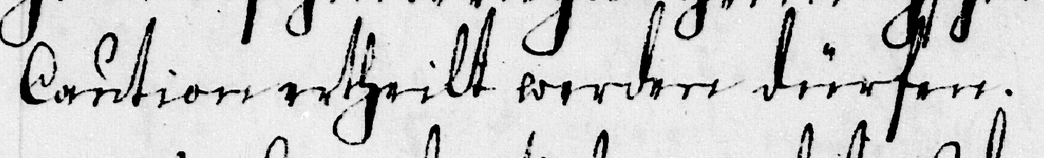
Caution ertheilt werden dürfen.
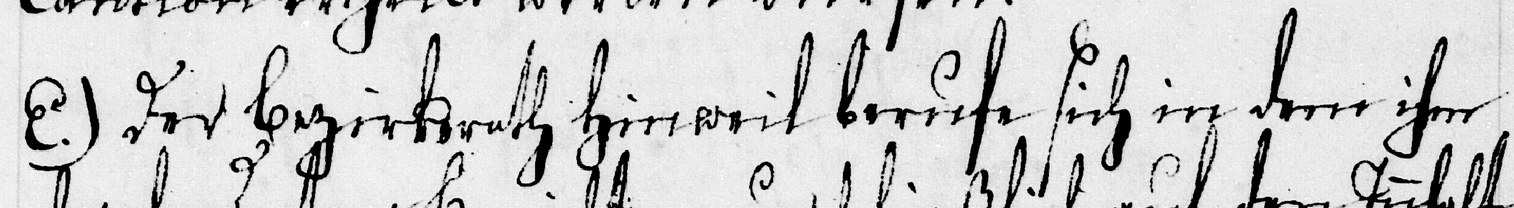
E.) Der Bezirksrath Hinweil berufe sich in dem ihm
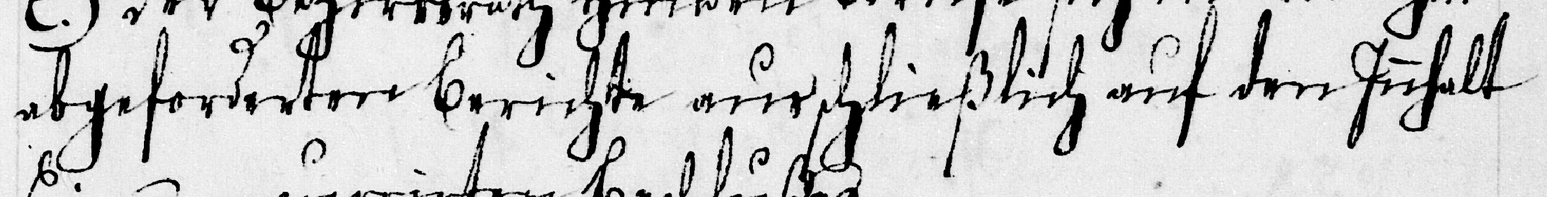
abgeforderten Berichte ausschließlich auf den Innhalt
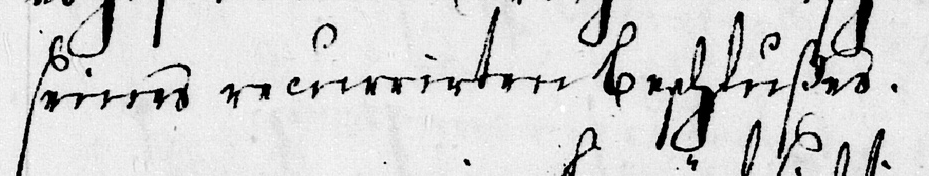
seines recurrirten Beschlußes.
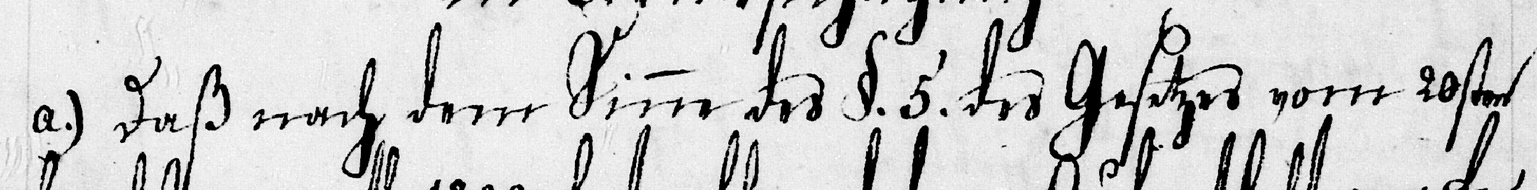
a.) Daß nach dem Sinne des §. 5. des Gesetzes vom 20sten
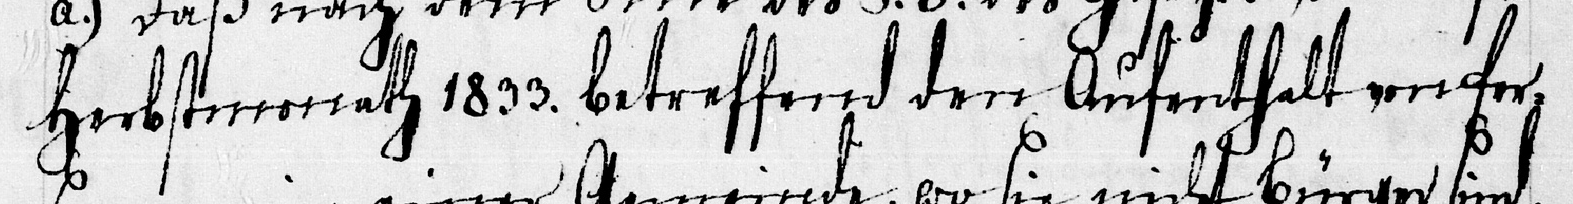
Herbstmonath 1833. betreffend den Aufenthalt von Per¬
